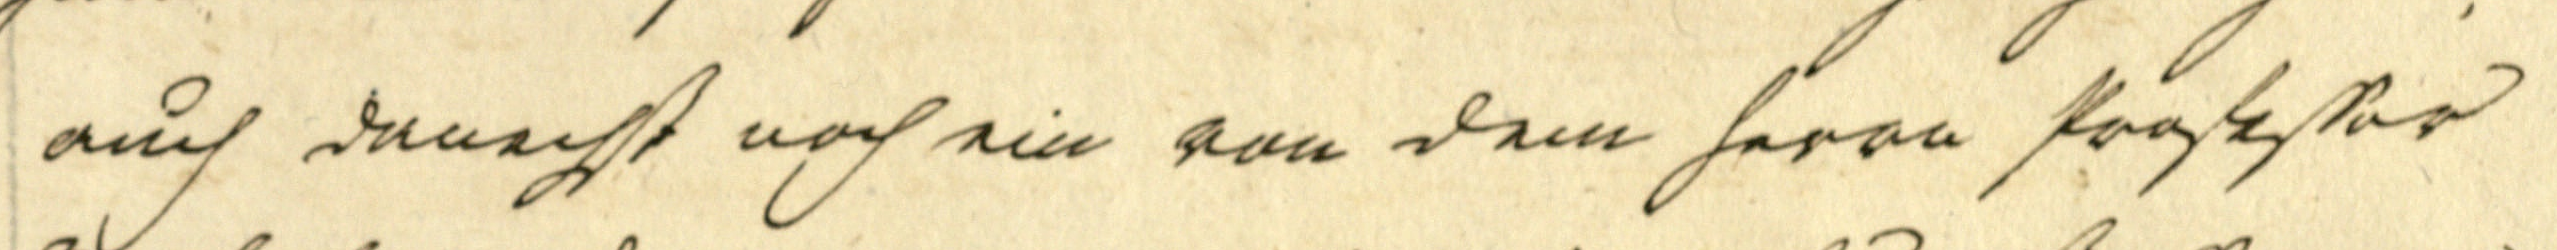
auch danechst noch ein von dem Herrn Professor
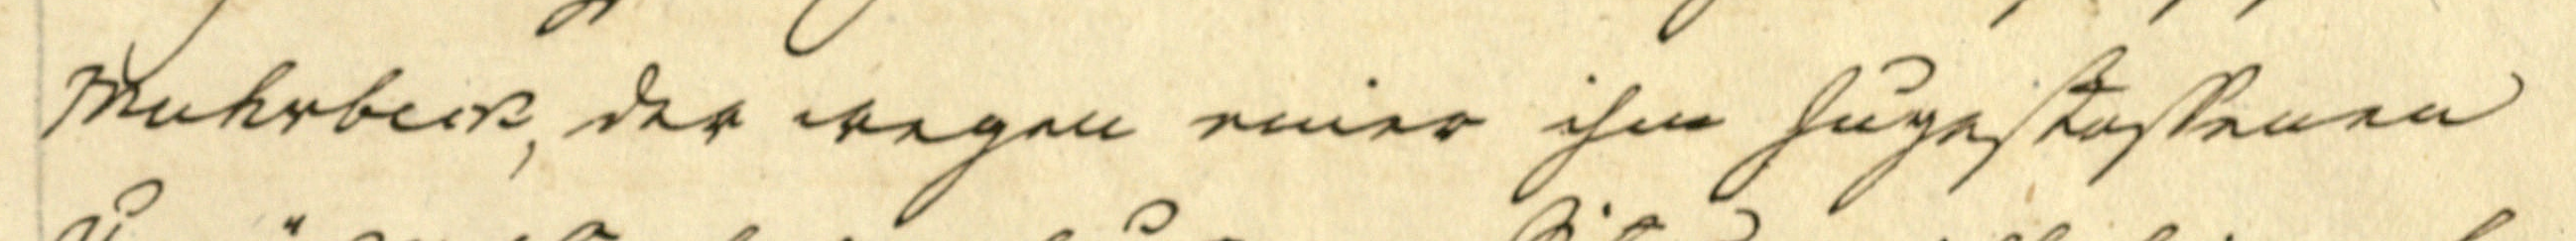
Muhrbeck, der wegen einer ihm zugestossenen
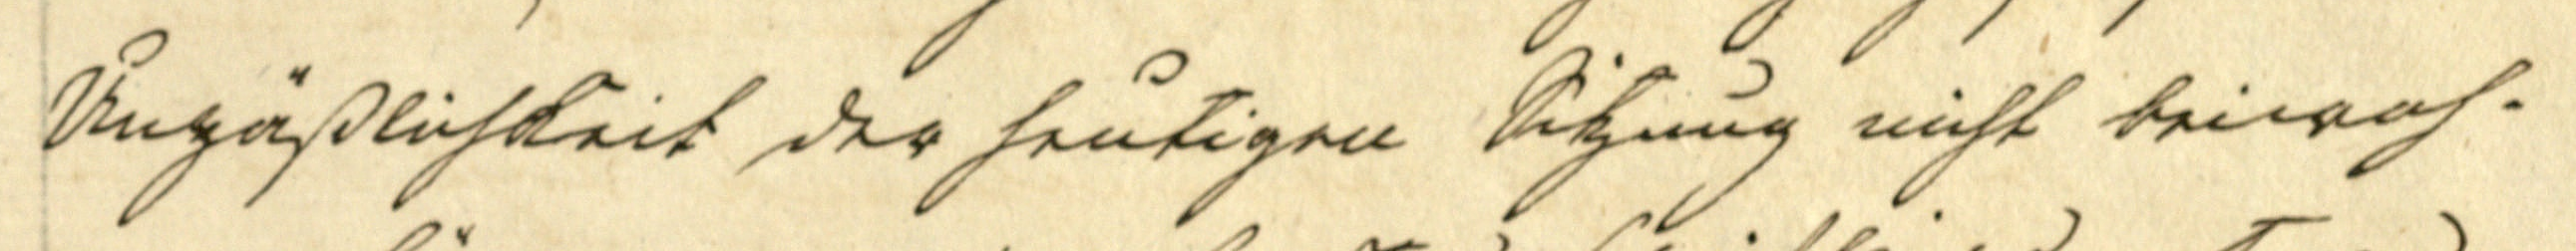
Unpäßlichkeit der heutigen Sitzung nicht beiwoh¬
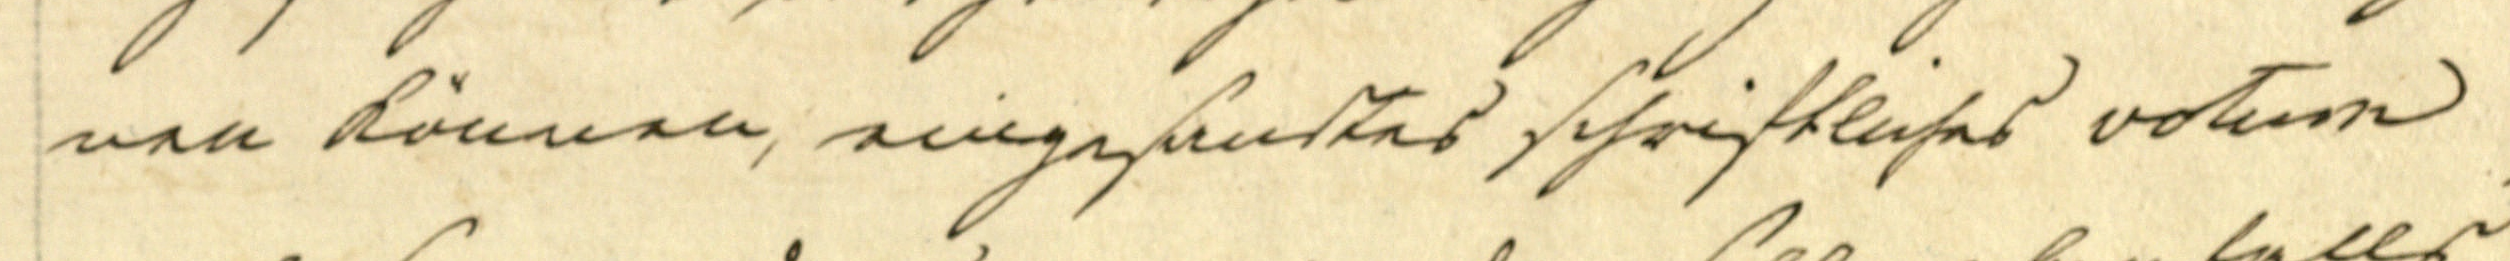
nen können, eingesandtes schriftliches votum
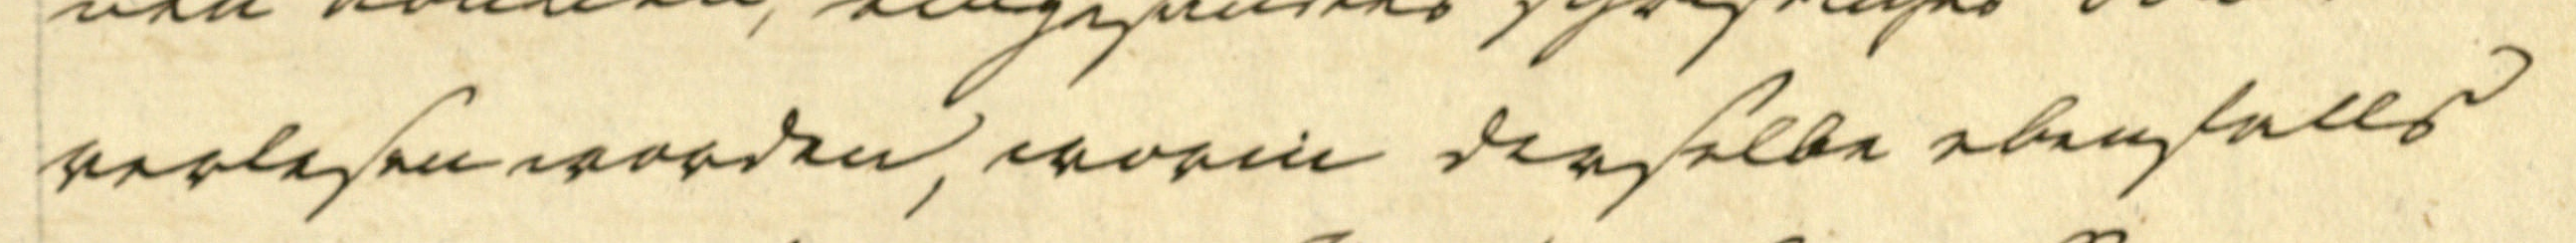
verlesen worden, worin derselbe ebenfalls
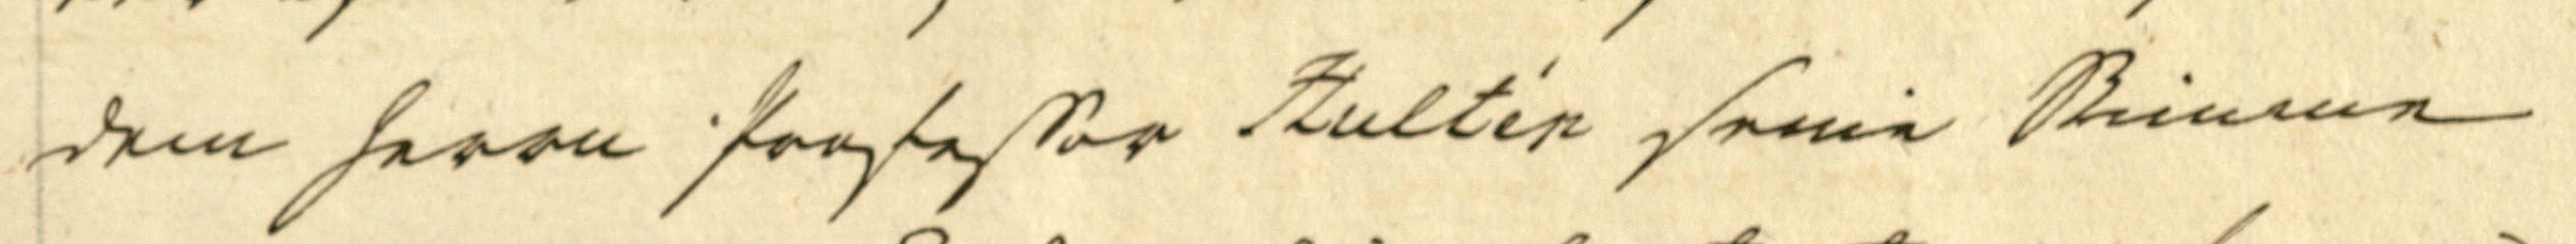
dem Herrn Professor Hultén seine Stimme
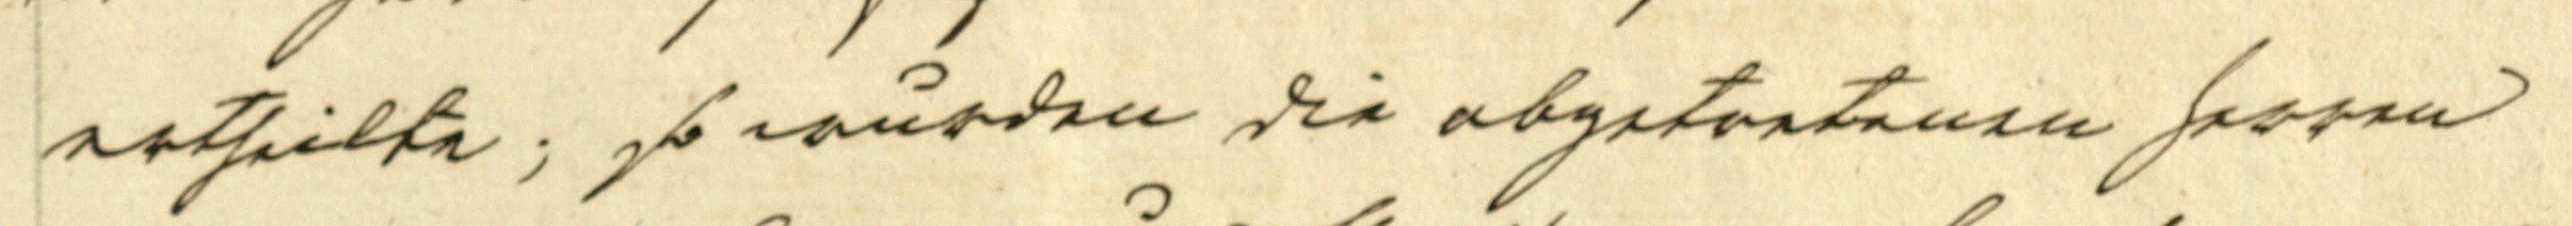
ertheilte; so wurden die abgetretenen Herren
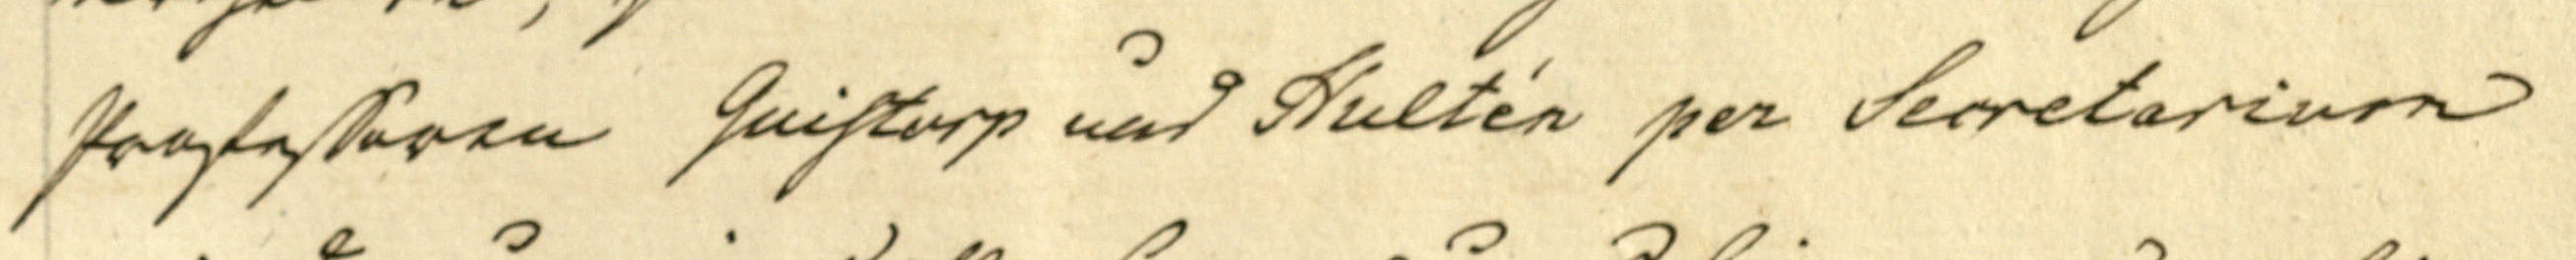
Professoren Quistorp und Hultén per Secretarium
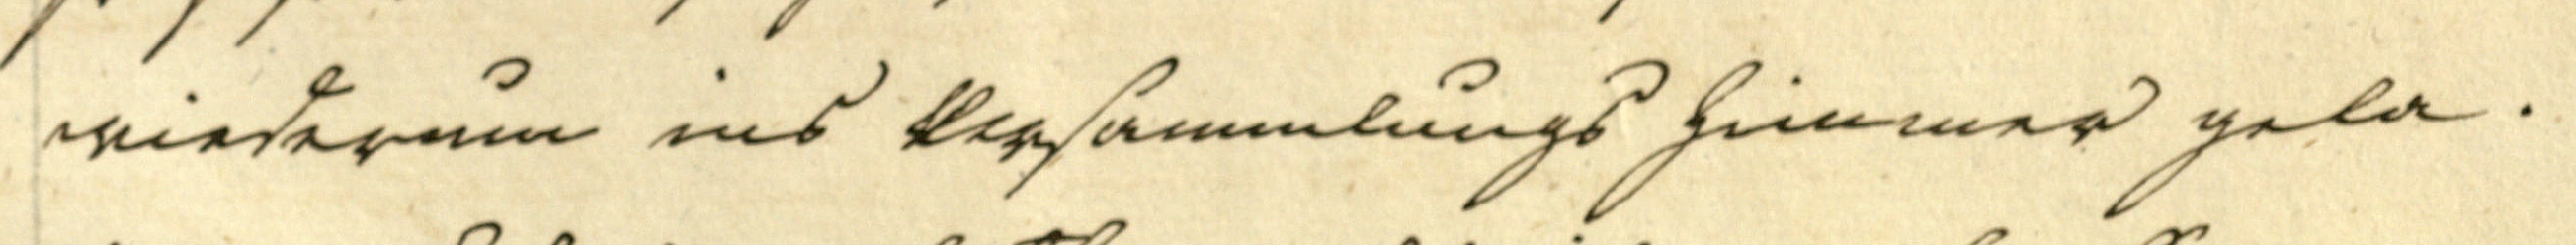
wiederum ins Versammlungs Zimmer gela¬
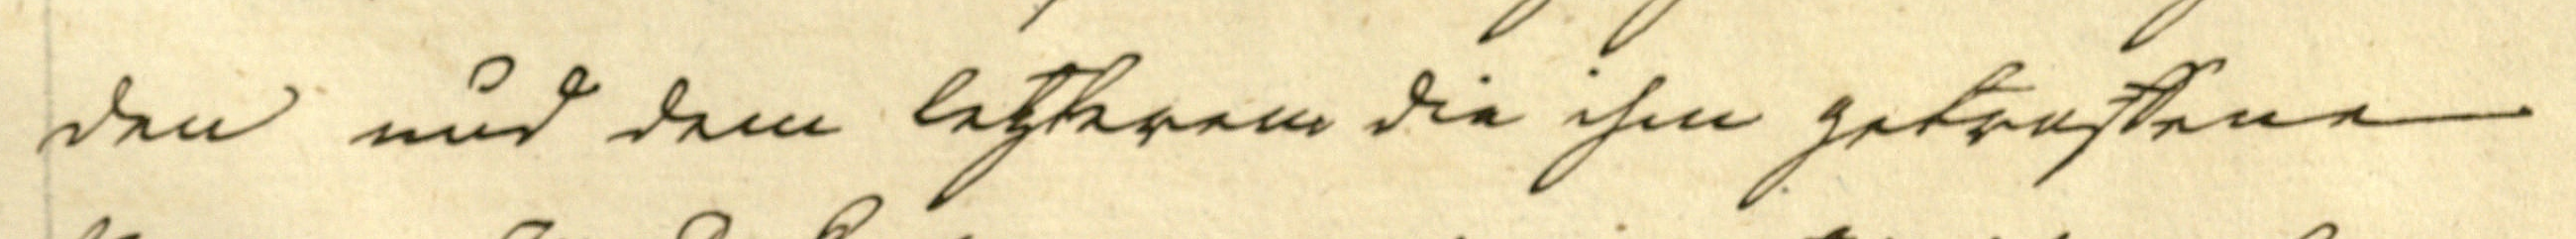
den und dem letzteren die ihm getroffene
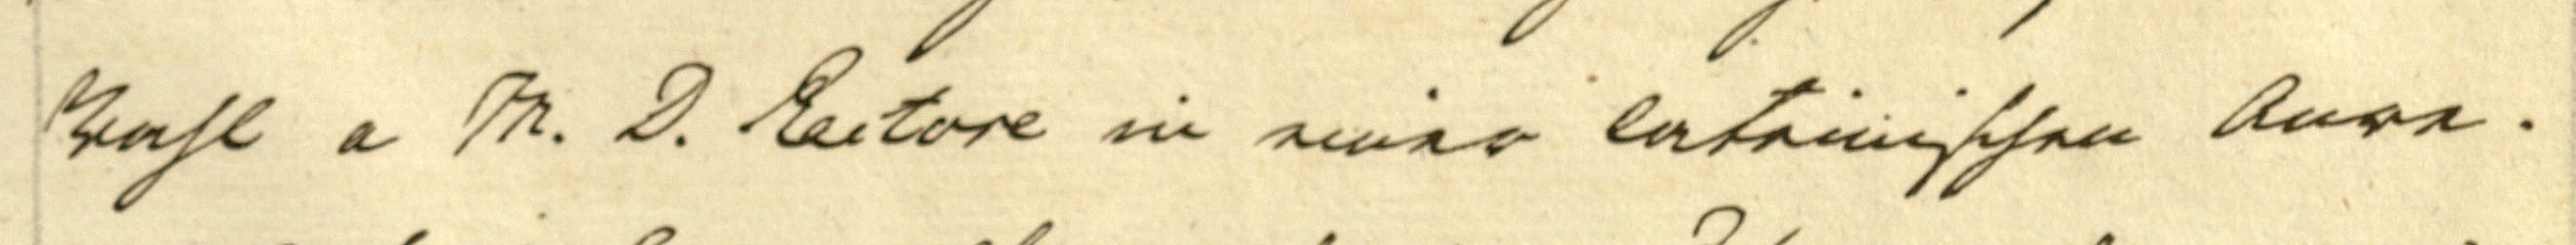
Wahl a M. D. Rectore in einer lateinischen Anre¬
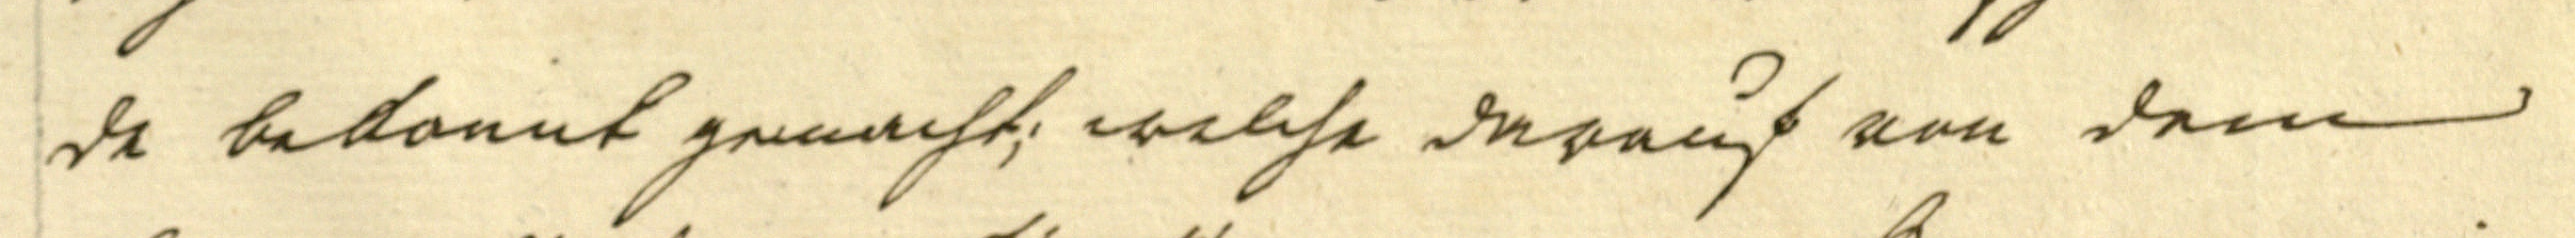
de bekannt gemacht; welche darauf von dem
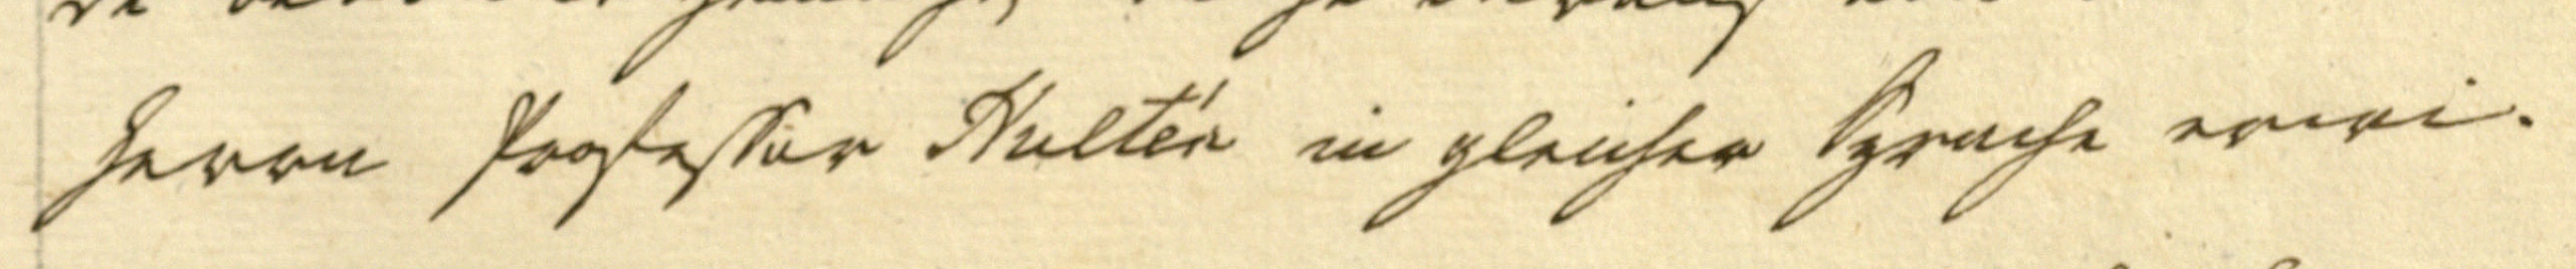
Herrn Professor Hultén in gleicher Sprache erwi¬
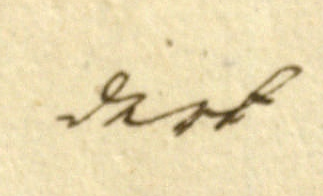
dert
